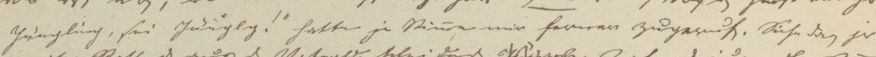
«Jüngling, sei Jüngling!» hatte jene Stimme mir ferner zugerufen. Siehe da, jr
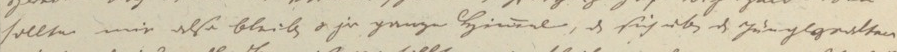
sollte mir also bleiben & jr ganze Himmel, der sich über dem Jünglgsalter
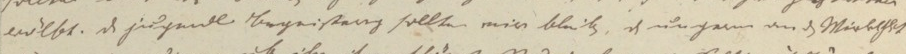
wölbt. Die jugendl. Begeisterung sollte mir bleiben, die ungern an der Wirklchkeit
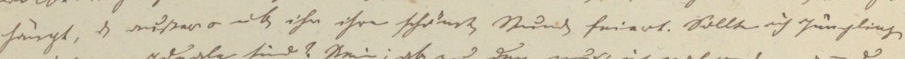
hängt, die außer & über ihr ihre schönsten Stunden feiert. Sollte ich Jünglingen
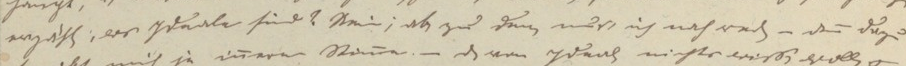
erzählen, ws Ideale sind? Nein, aber zu denen muß ich noch reden – denn dazu
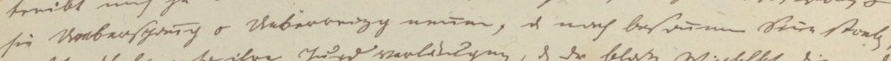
sie Ueberspannung & Ueberreizung nennen, die nach besonnenem Sinne streben,
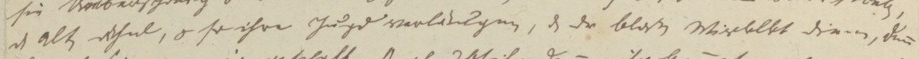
den alten ...nl, & so ihre Jugd verläugnen, & dr bloßen Wirklichkeit dienen, denn
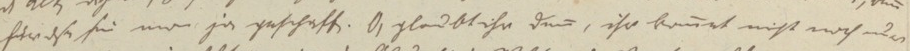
für dse sei man ja geschaffen. O, glaubt ihr denn, ihr kommet nicht noch nur
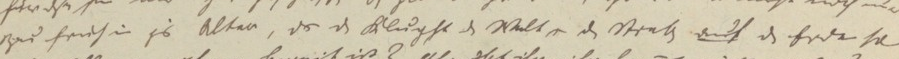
zu früh in js Alter, ds der Klugheit der Welt & dem Streben auf der Erde so
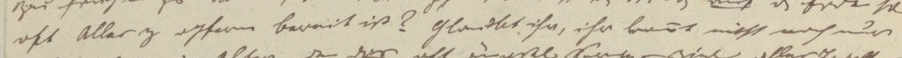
oft Alles z. opfern bereit ist? Glaubt ihr, ihr kommt nicht noch nur
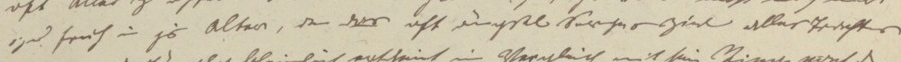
zu früh in js Alter, da das oft ängstl. Sorge & Ziel alles Trachtens
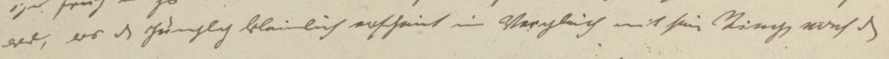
wd, ws dem Jüngling kleinlich erscheint im Vergleich mit seinem Ringen nach dem
